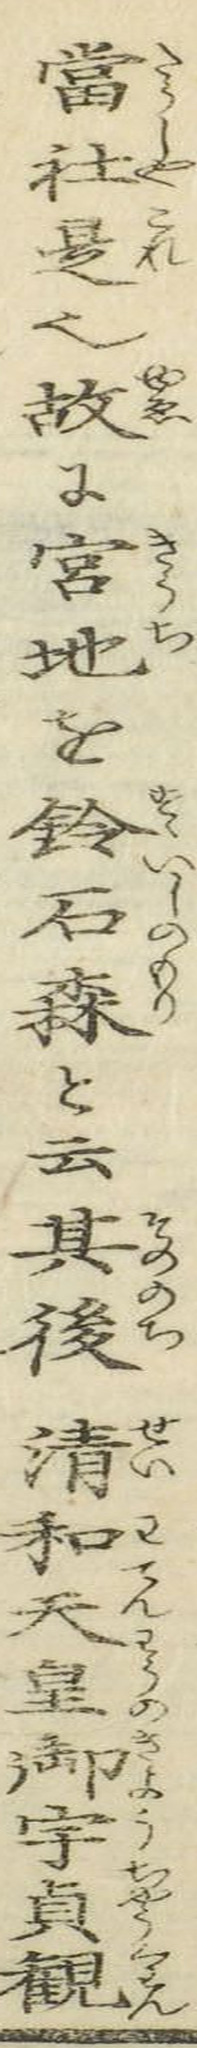當社是也故に宮地を鈴石森と云其後清和天皇御宇貞観
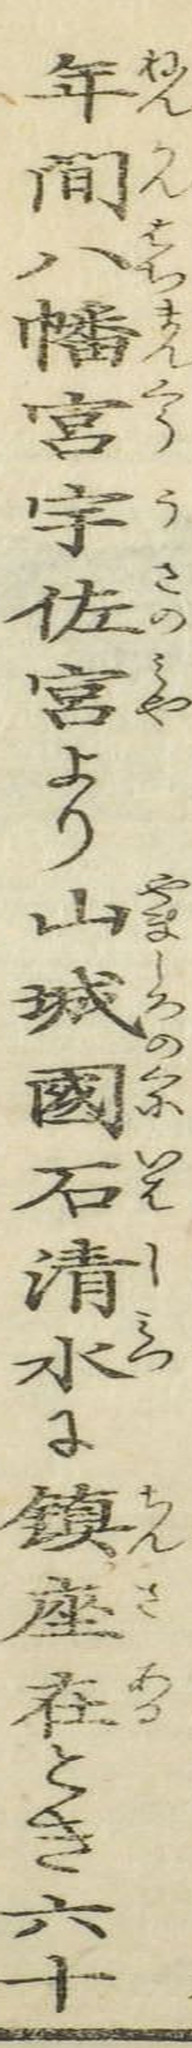年間八幡宮宇佐宮より山城國石清水に鎮座在とき六十
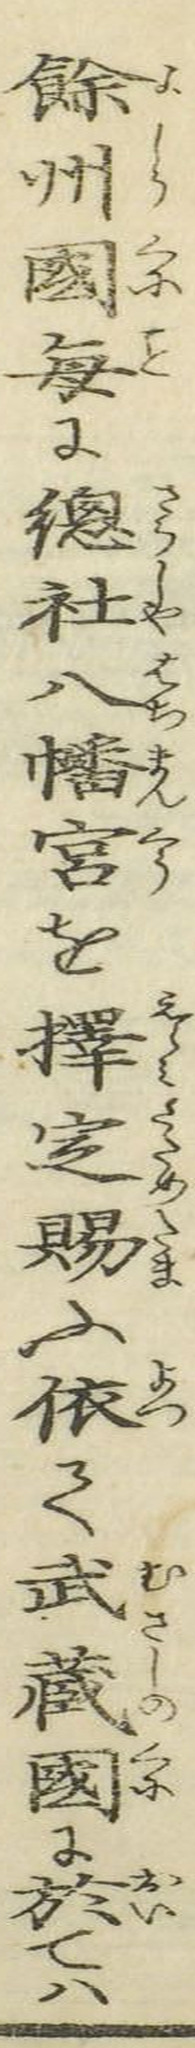餘州國毎に總社八幡宮を擇定賜ふ依て武藏國に於ては
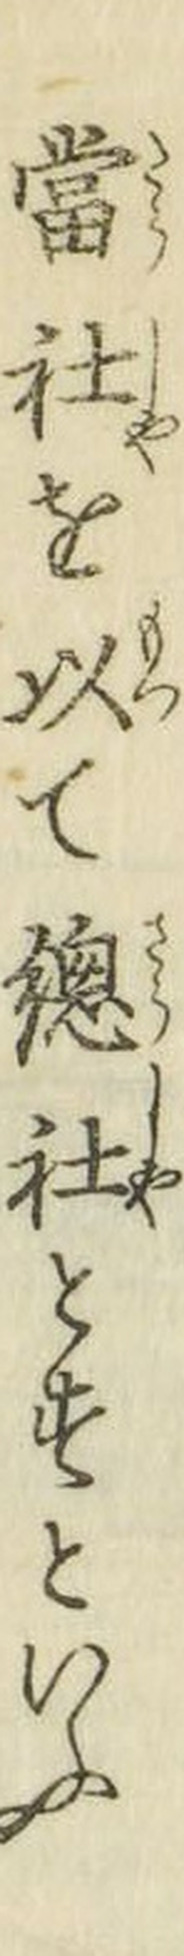當社を以て總社とすといふ
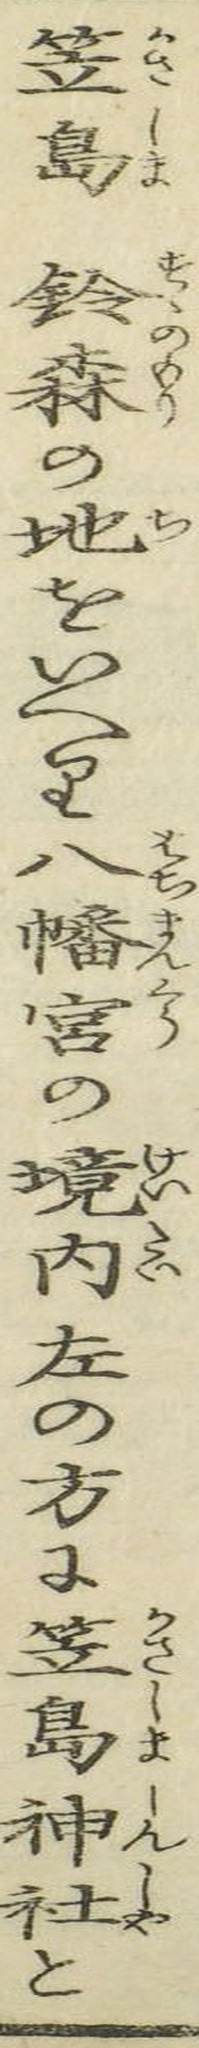笠島鈴森の地をいへり八幡宮の境内左の方に笠島神社と
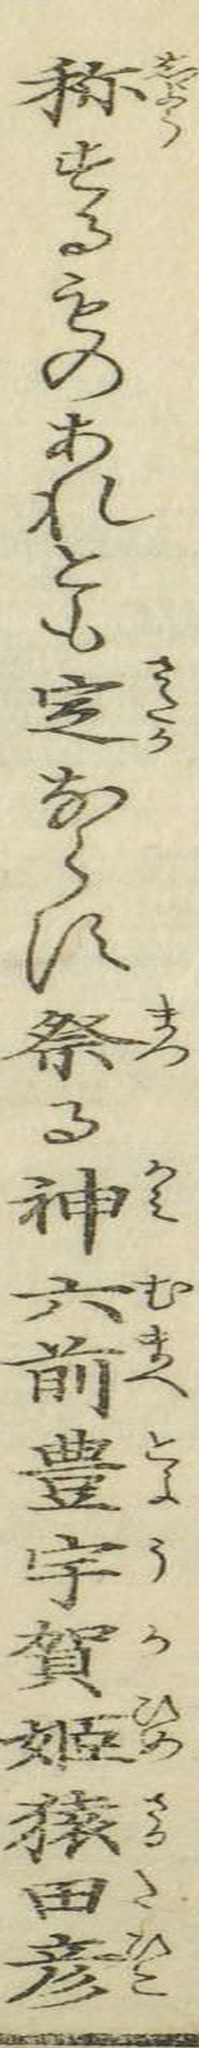称するものあれとも定ならす祭る神六前豊宇賀姫猿田彦
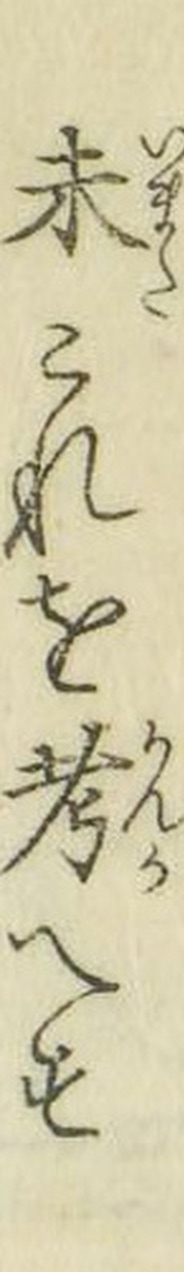未これを考へす

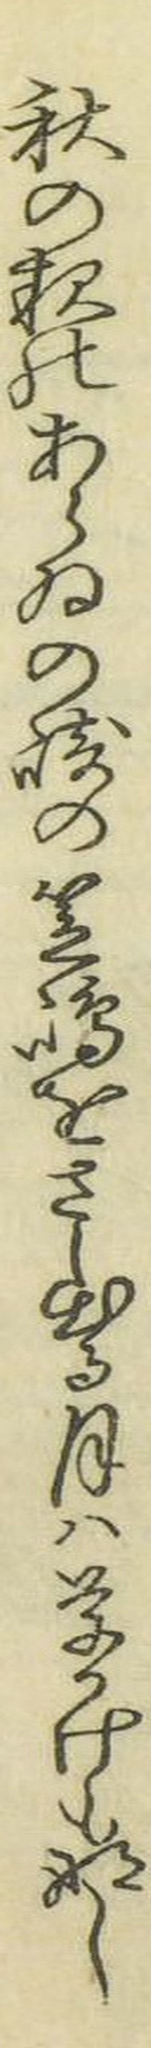秋の夜のあらゐの崎の笠嶋をさし出る月は草かけもなし為家
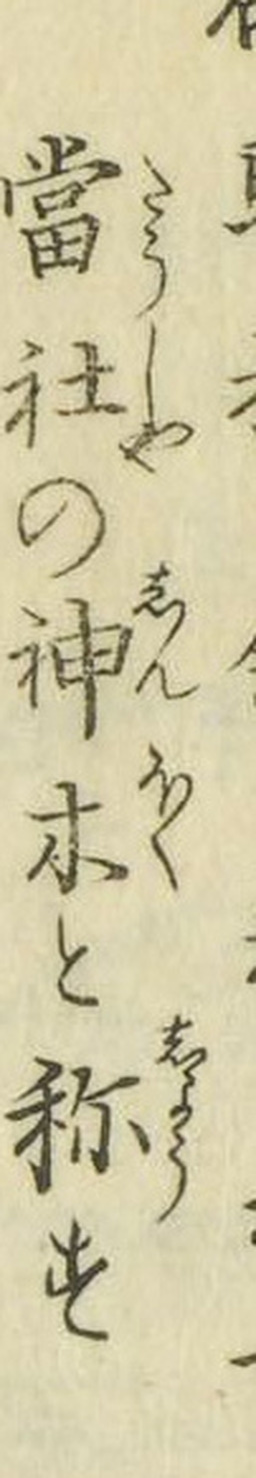當社の神木と称す
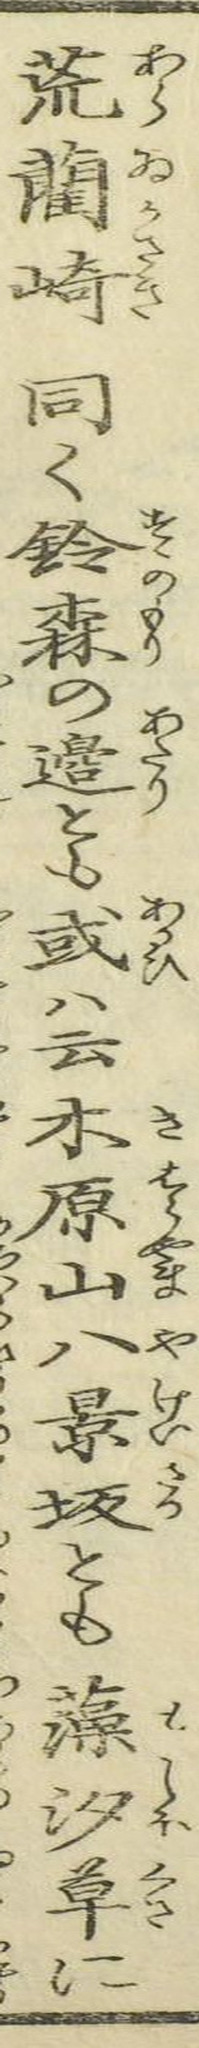荒藺崎同く鈴森の邉とも或は云木原山八景坂とも藻汐草に
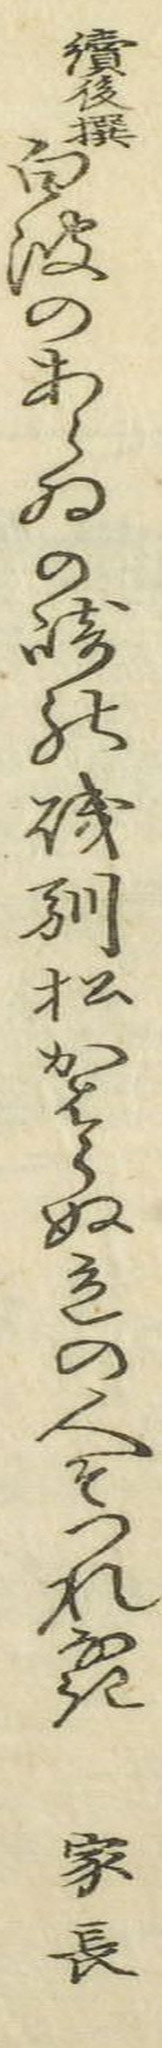白波のあらゐの崎の磯馴松かはらぬ色の人そつれなき家長
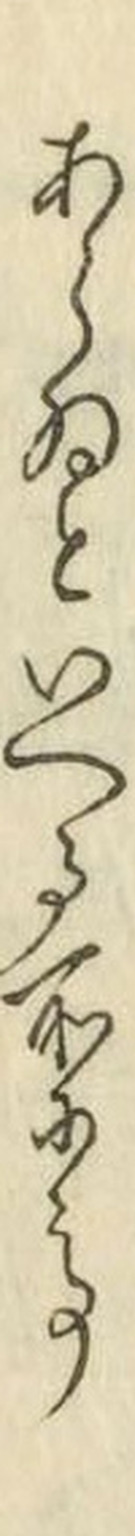あらゐといへる所にて
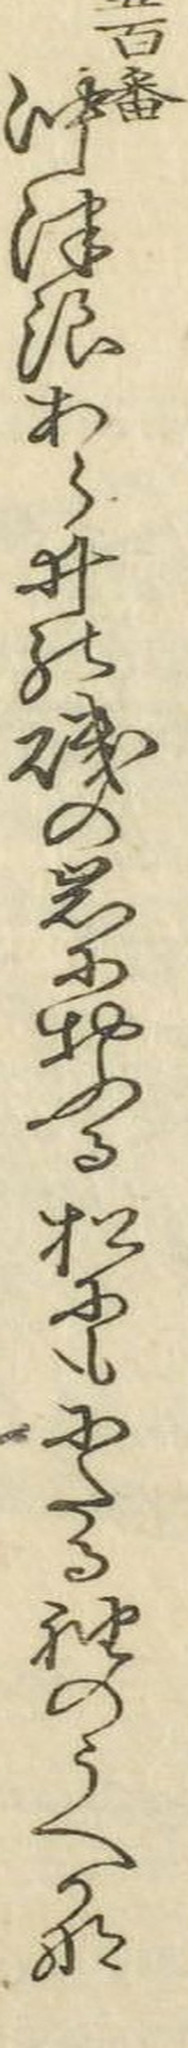沖津浪あらゐの磯の岩におふる松にもにたる袖のうへかな
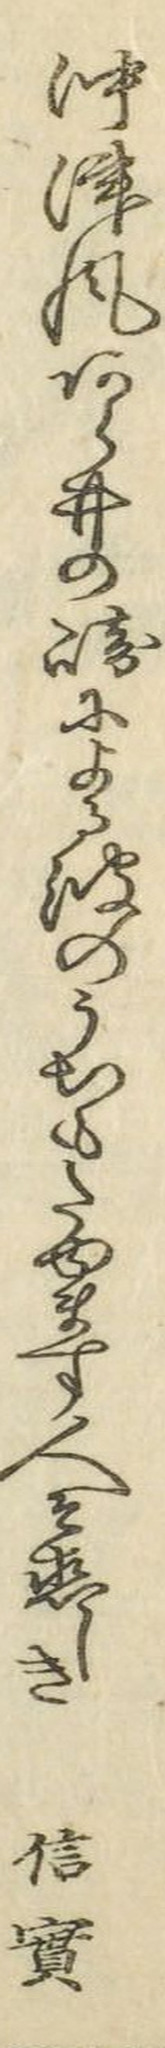沖津風あらゐの崎による波のうちもたゆます人そ恋しき信實
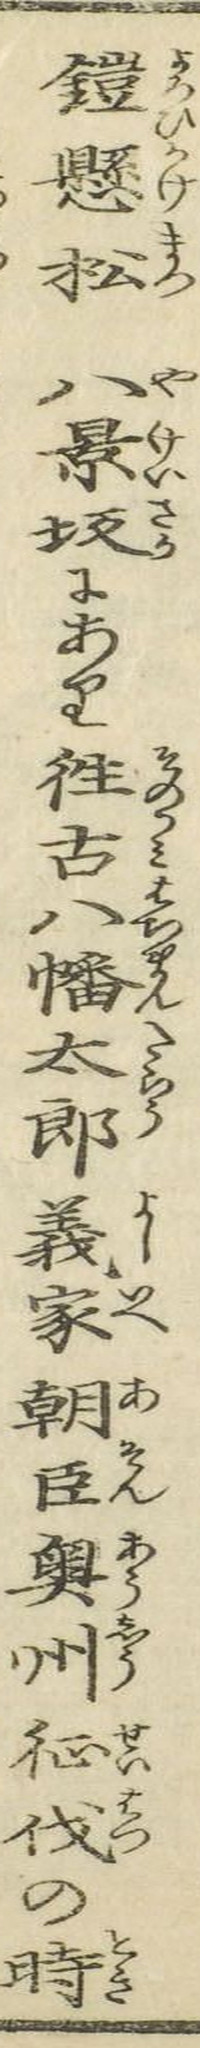鎧懸松八景坂にあり往古八幡太郎義家朝臣奥州征伐の時
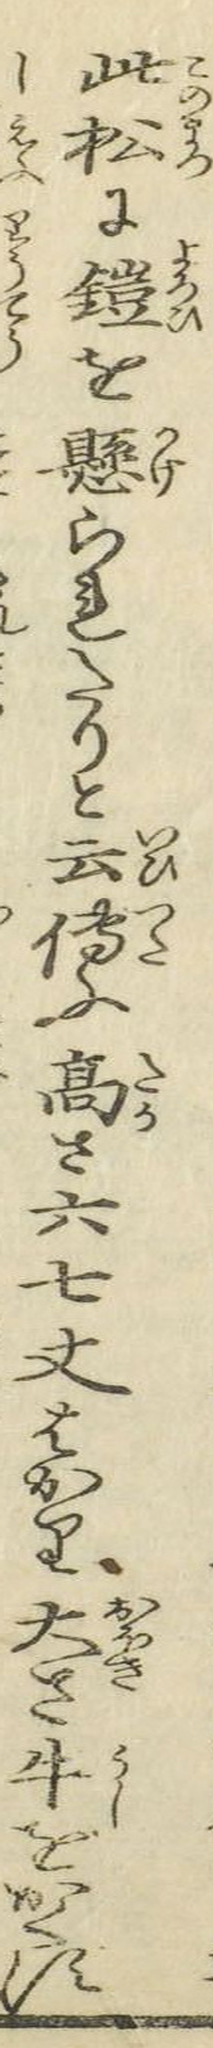此松に鎧を懸られたりと云傳ふ髙さ六七丈はかり大さ牛をかくす
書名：江戸名所図会 20巻 巻之4
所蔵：東京学芸大学教育コンテンツアーカイブ
